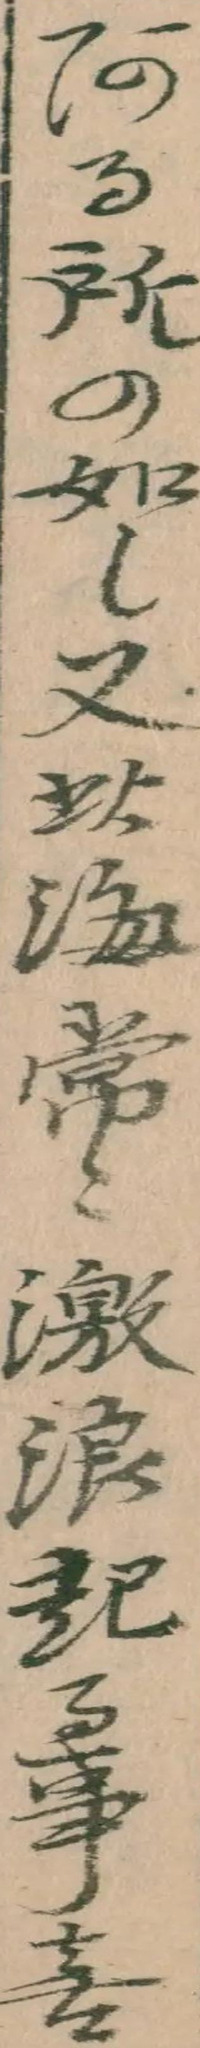ある所の如し又此海常々激浪起る事喜
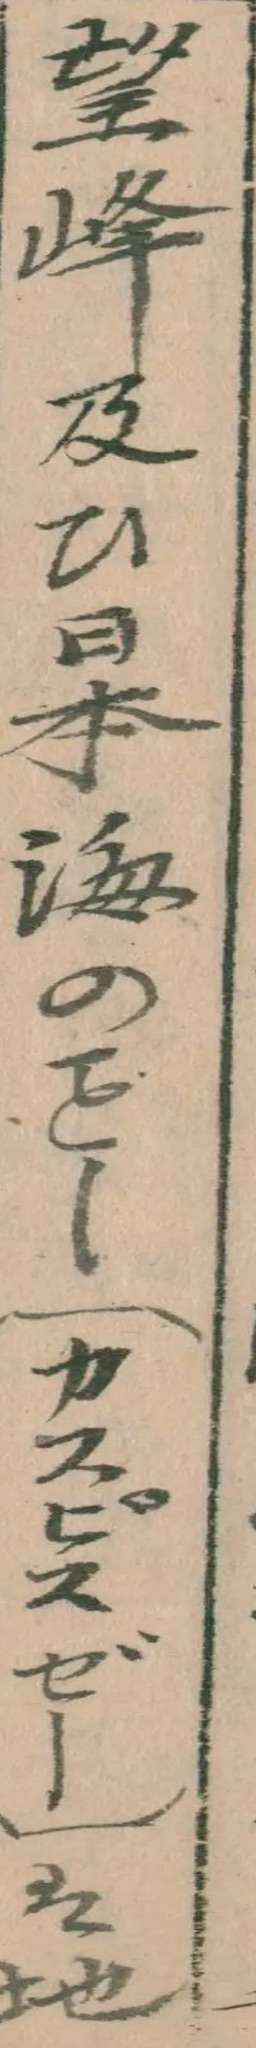望峰及ひ日本海のことし(カスピスゼー)は地
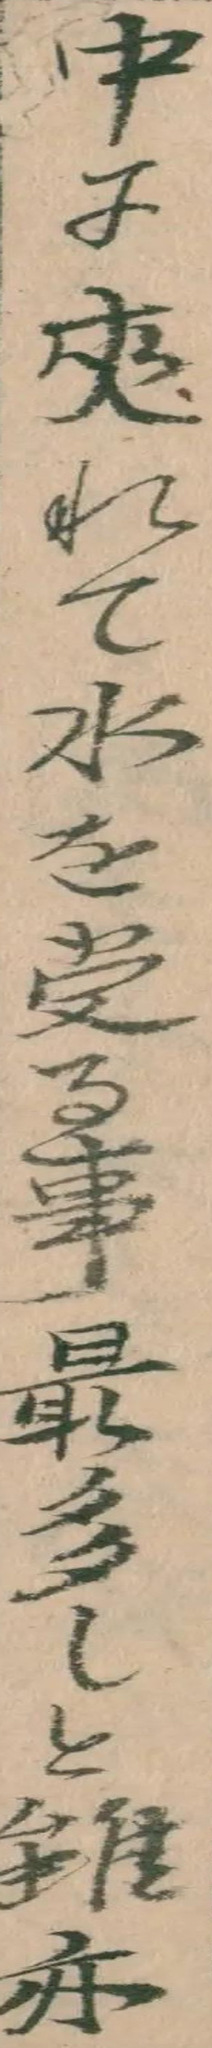中に夾れて水を受る事最多しと雖亦
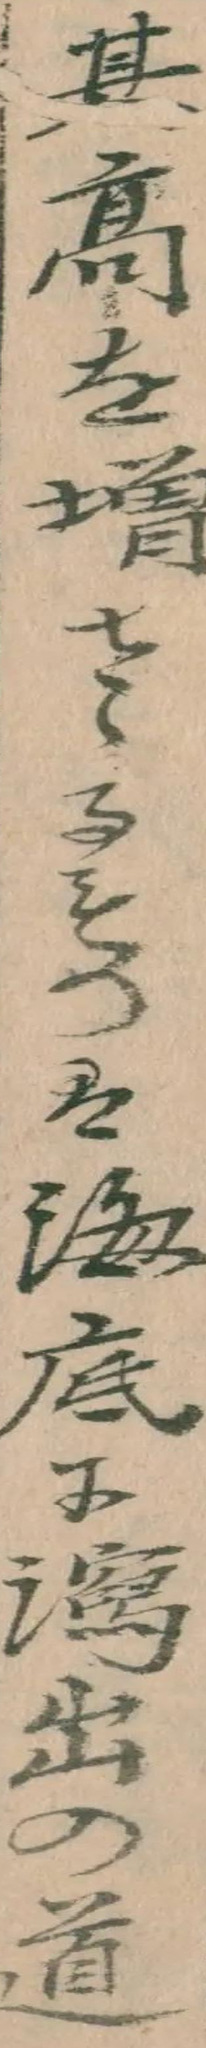其高を増さゝるものは海底に瀉出の道
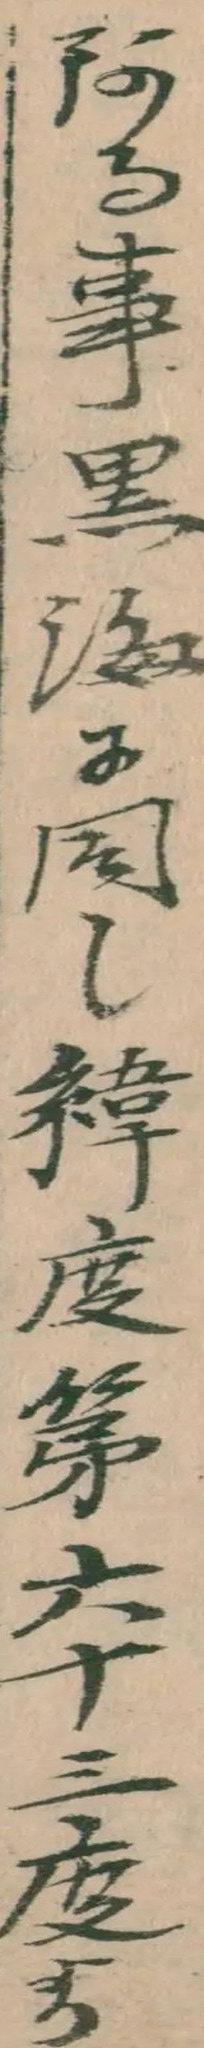ある事黒海に同し緯度第六十三度より

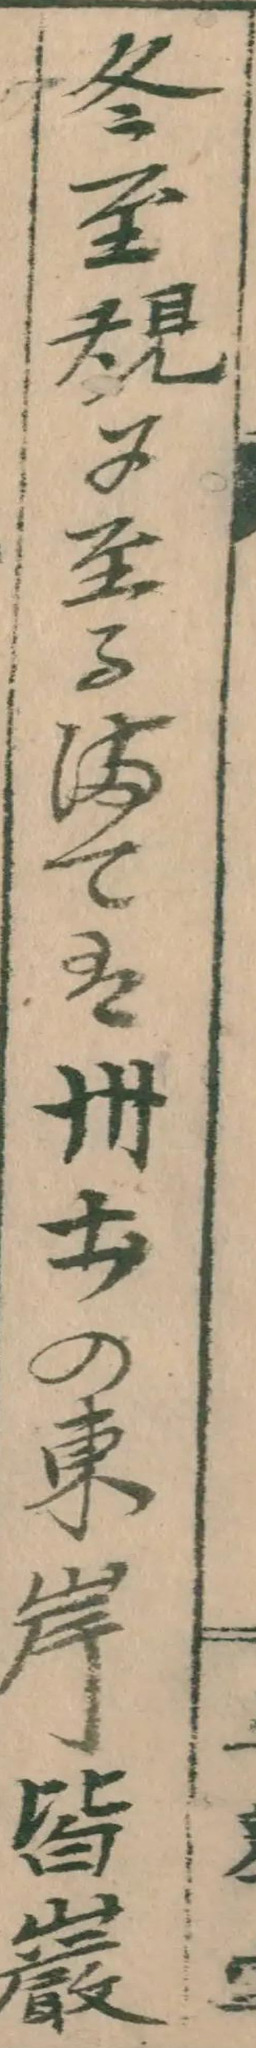冬至規に至るまては州土の東岸皆巌
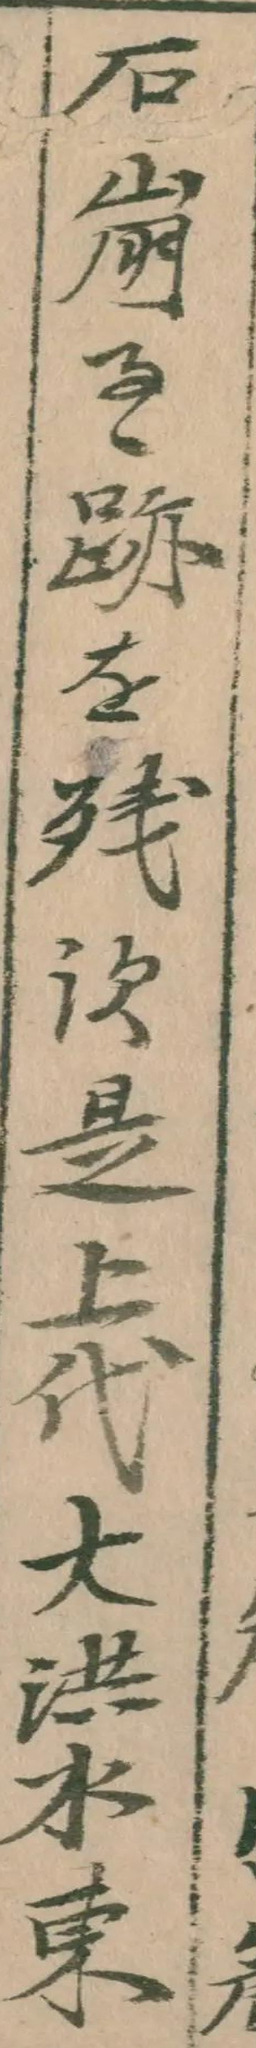石崩るゝ跡を残す是上代大洪水東
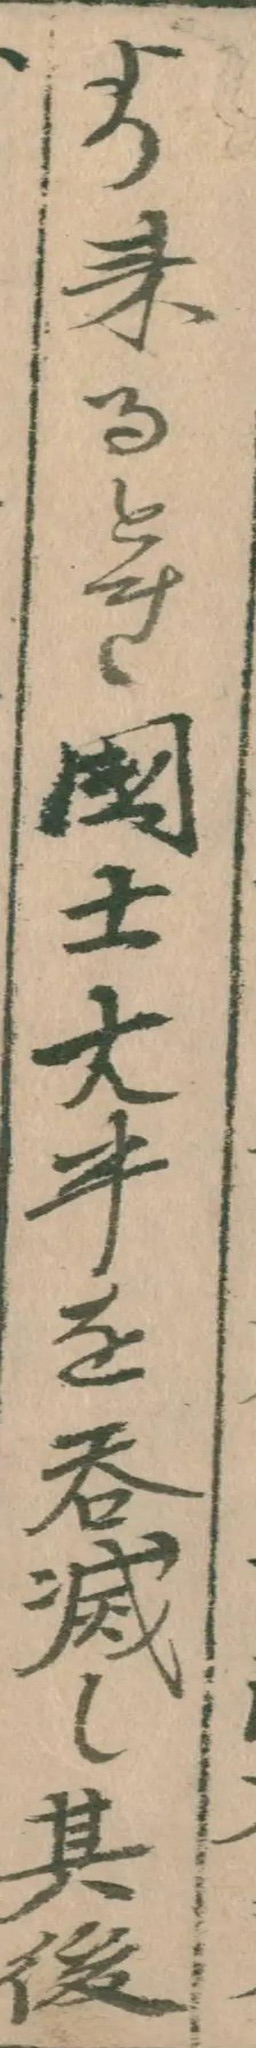より来るとき国土大半を呑滅し其後
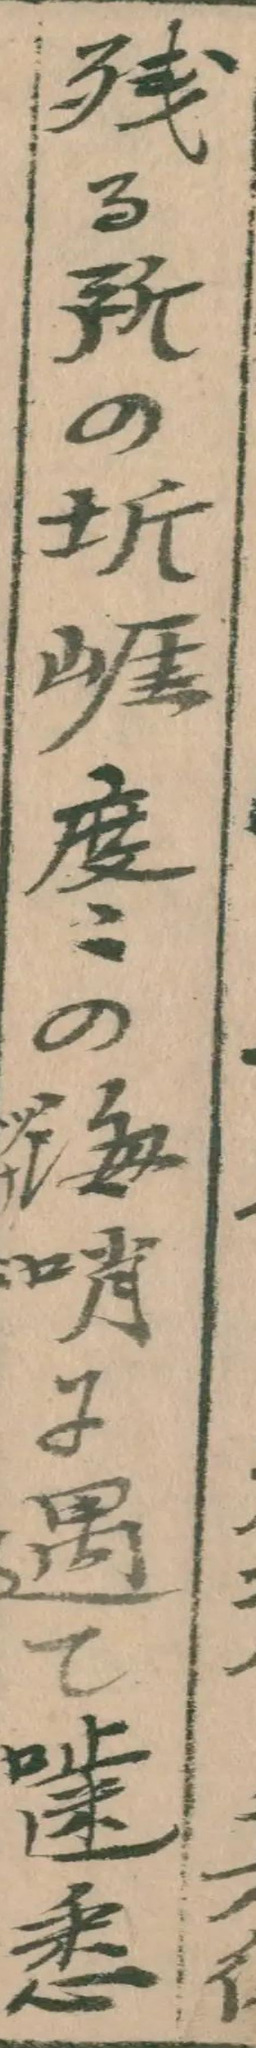残る所の圻崖度々の海哨に遇て噛悉
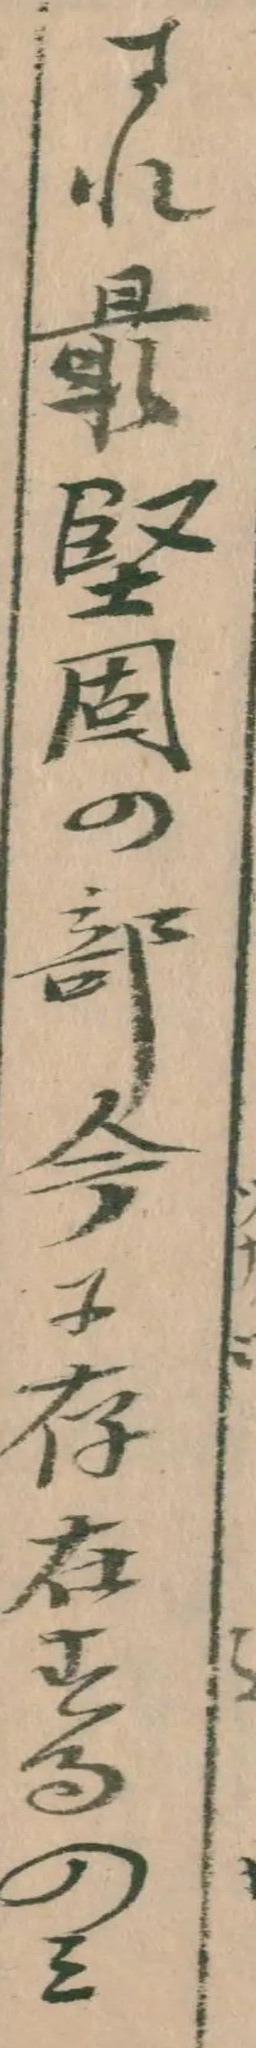され最堅固の部今に存在するのみ
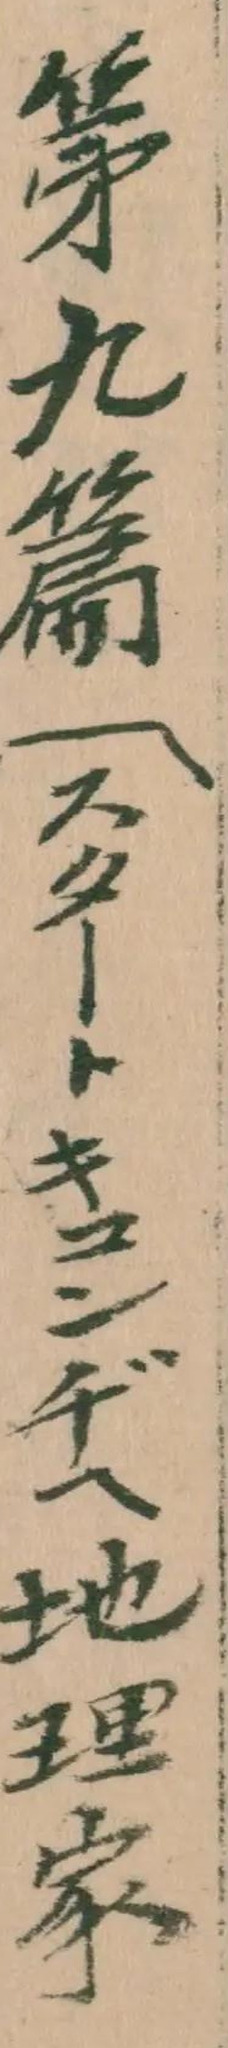第九篇(スタートキュンヂヘ地理家
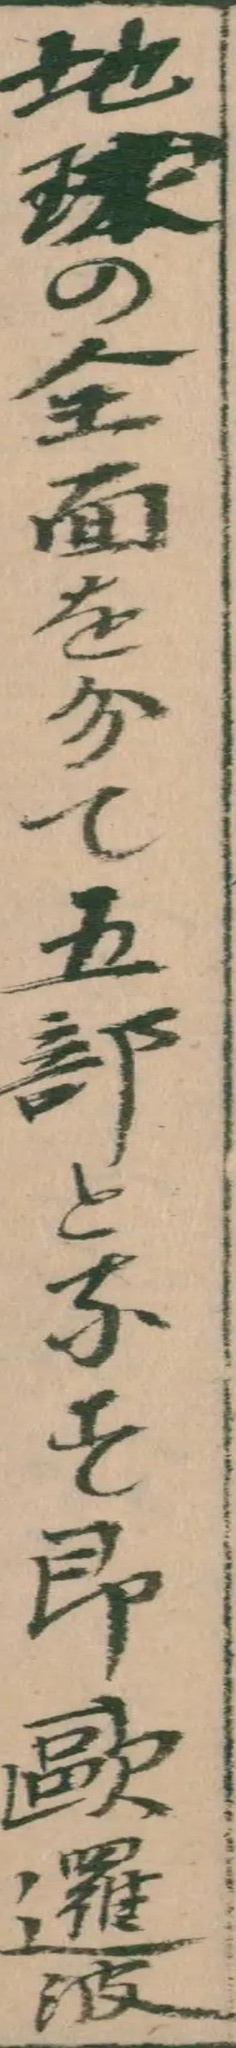地球の全面を分て五部となす即欧邏波
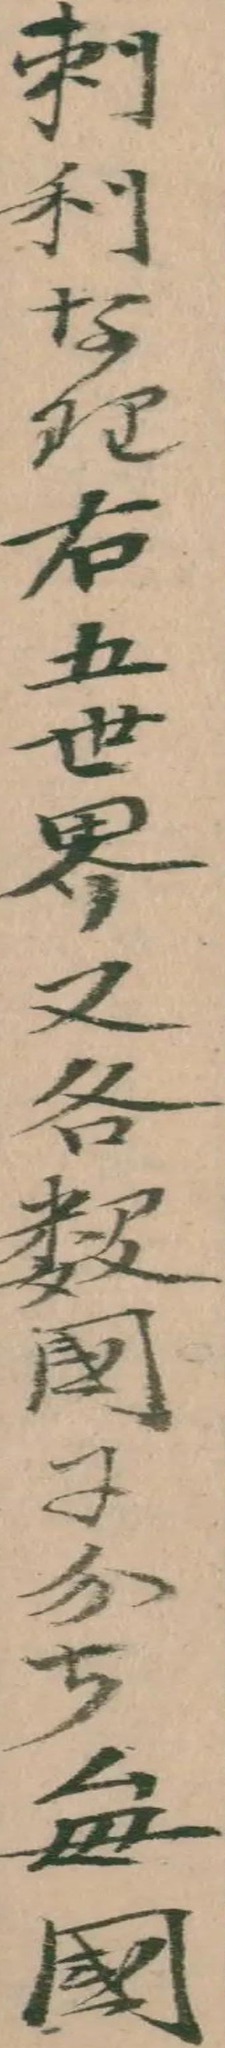刺利なり右五世界又各数国に分ち毎国
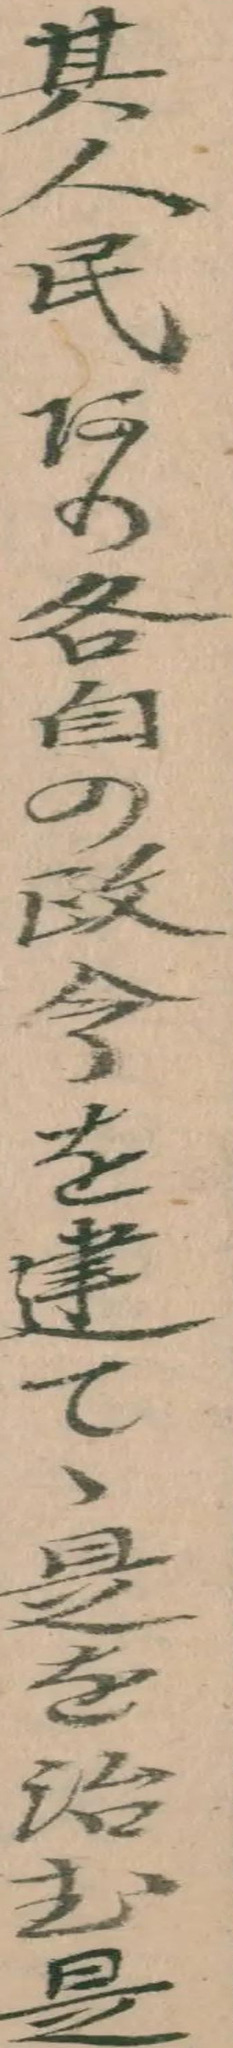其人民あり各自の政令を建てゝ是を治む是
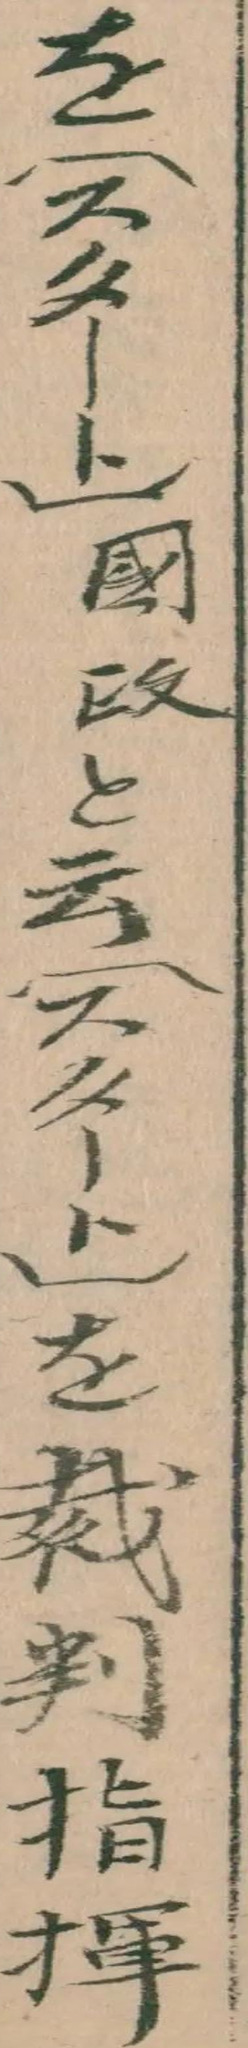を(スタート)国政と云(スタート)を裁判指揮
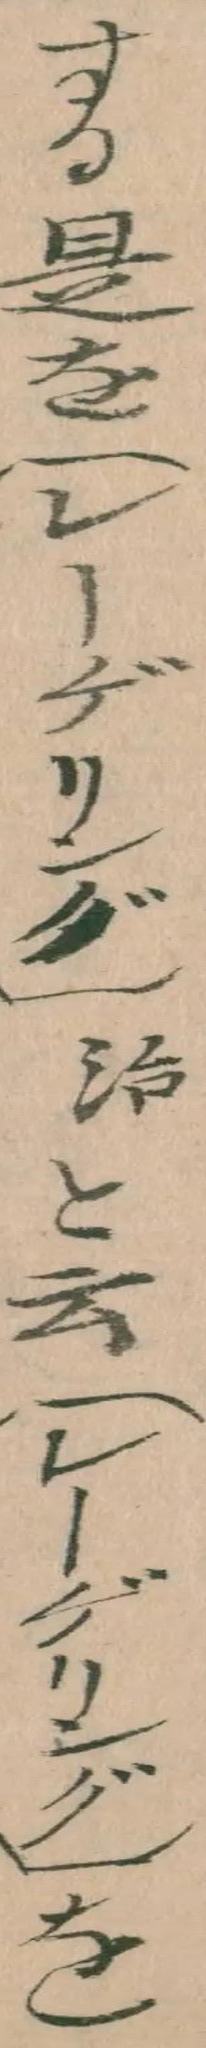する是を(レーゲリング)治と云(レーゲリング)を
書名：新釈輿地図説
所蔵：国立国会図書館 National Diet Library, JAPAN
